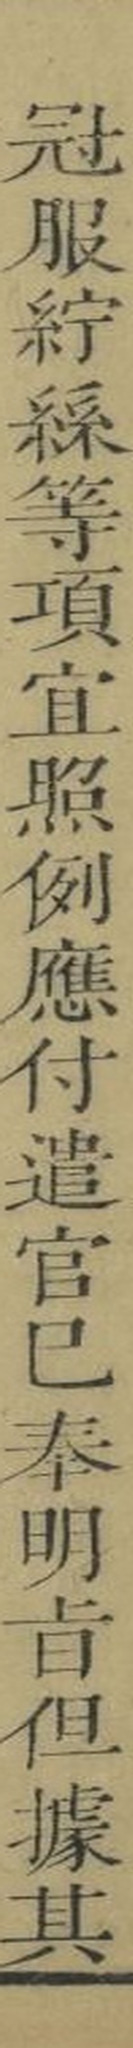冠服紵糸等項宜照例応付遣官巳奉明旨但拠其
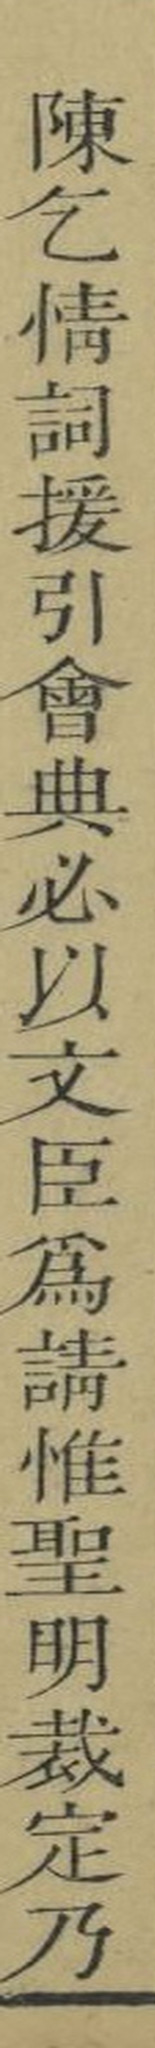陳乞情詞援引会典必以文臣為請惟聖明裁定乃
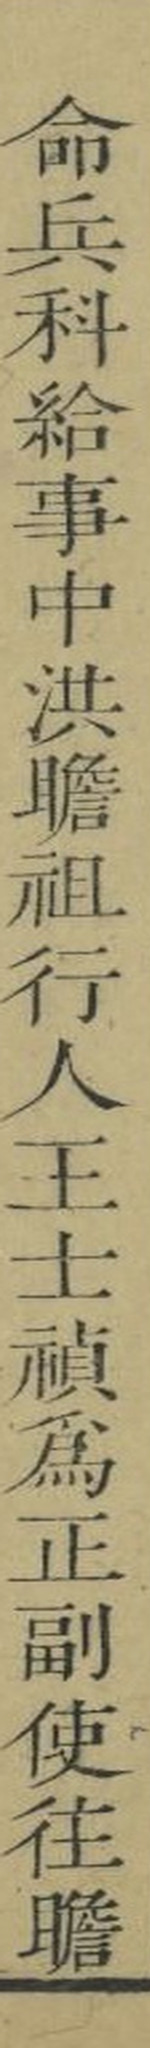命兵科給事中洪瞻祖行人王士禎為正副使往瞻
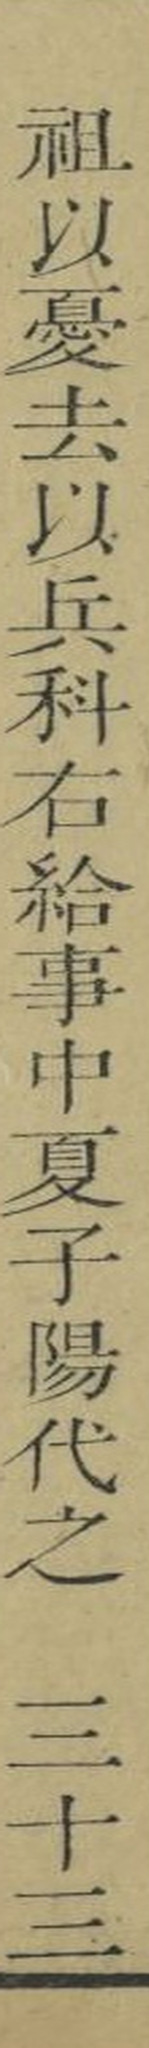祖以憂去以兵科右給事中夏子陽代之三十三
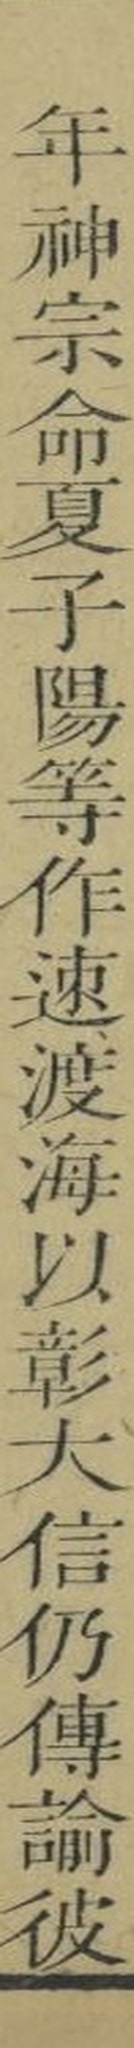年神宗命夏子陽等作速渡海以彰大信仍伝諭彼
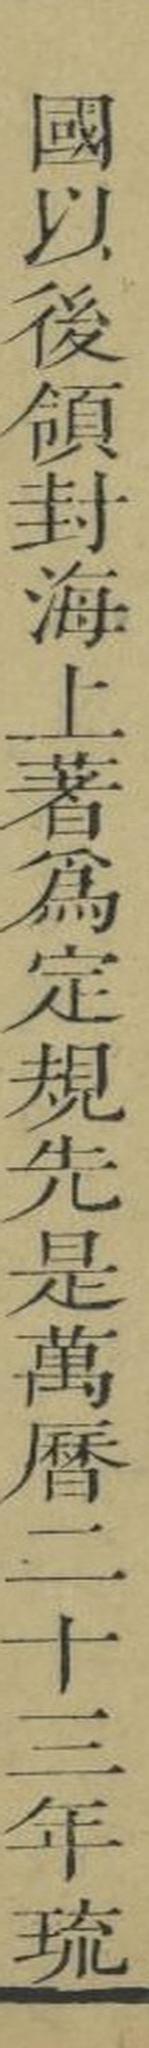国以後領封海上著為定規先是万暦二十三年琉
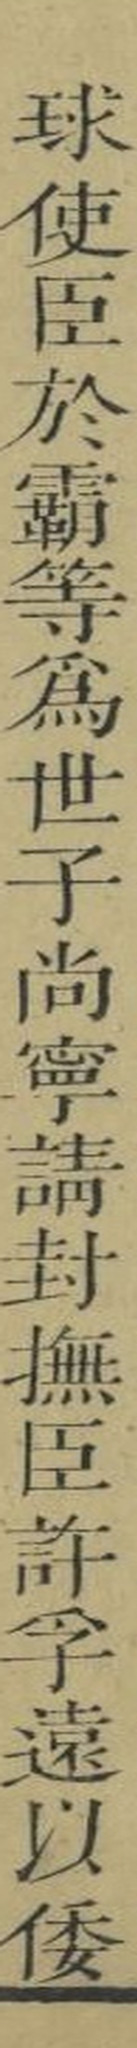球使臣於覇等為世子尚寧請封撫臣許孚遠以倭
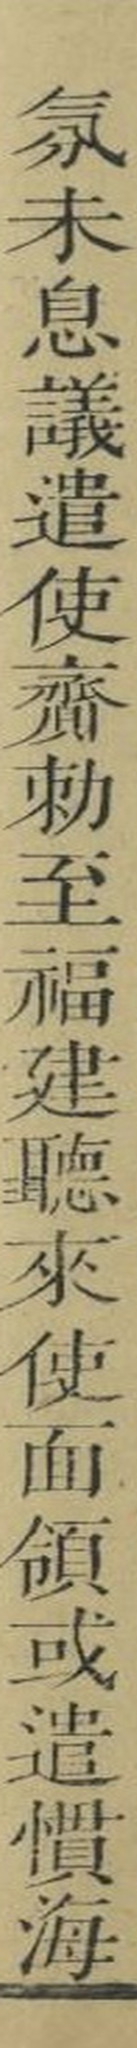氛未息議遣使齎勅至福建聴来使面領或遣慣海
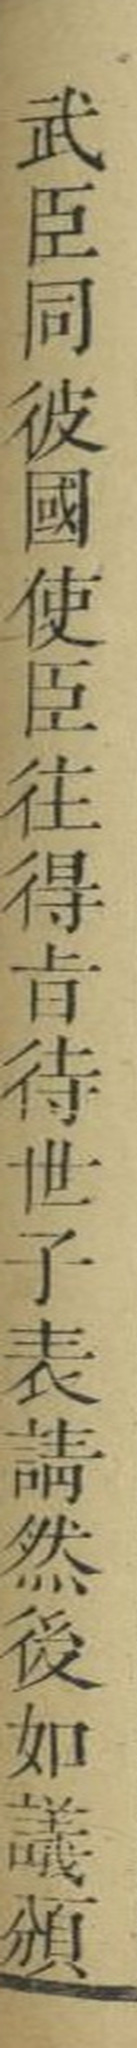武臣同彼国使臣往得旨待世子表請然後如議頒
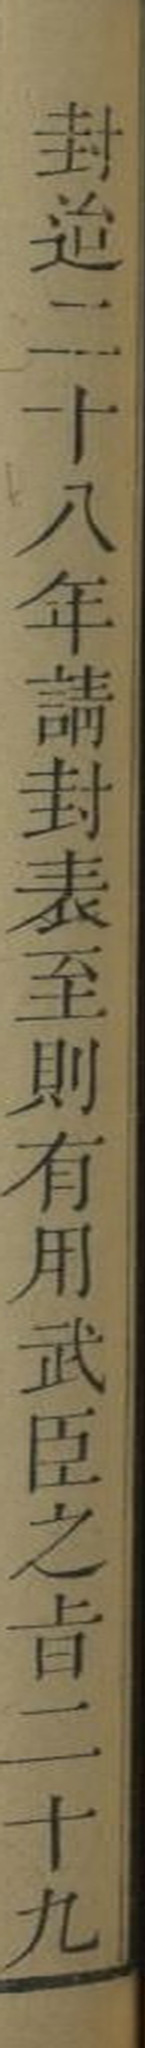封迨二十八年請封表至則有用武臣之旨二十九
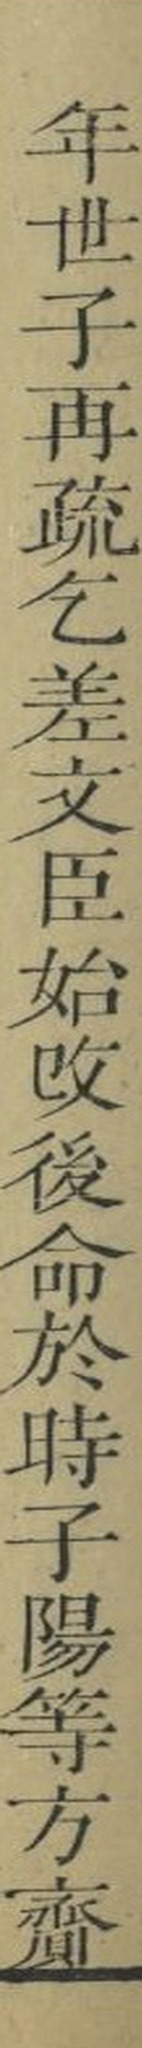年世子再疏乞差文臣始改後命於時子陽等方齎
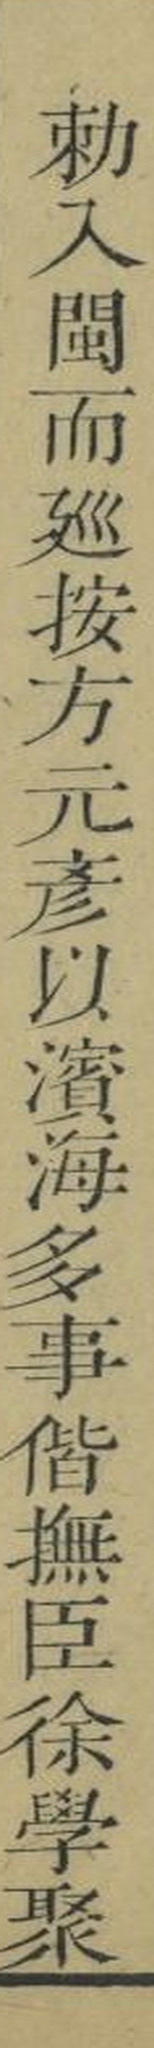勅入閩而巡按方元彦以浜海多事偕撫臣徐学聚
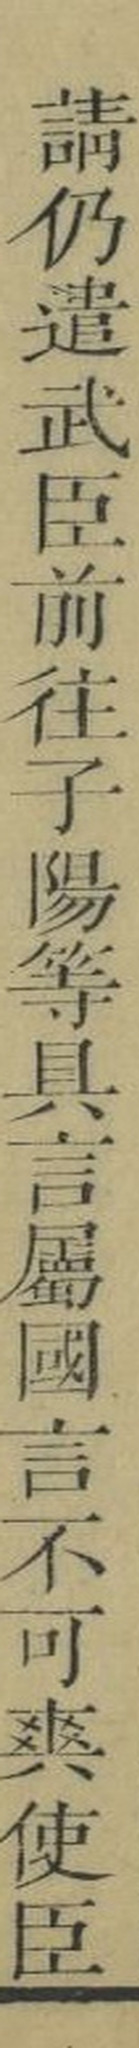請仍遣武臣前往子陽等具言属国言不可爽使臣
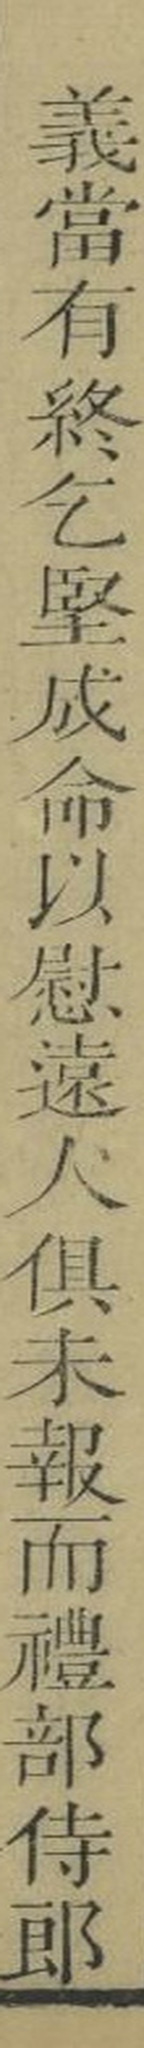義当有終乞堅成命以慰遠人俱未報而礼部侍郎
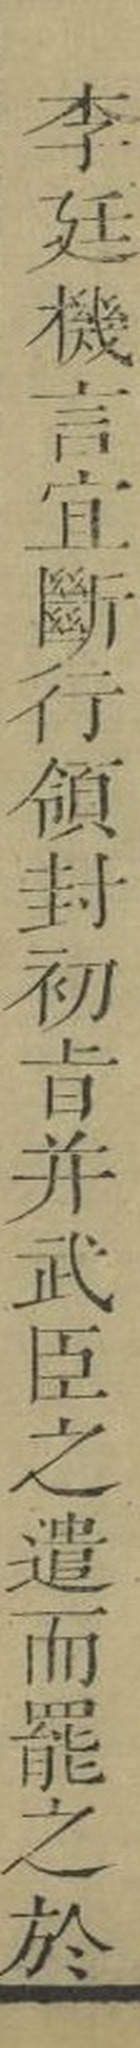李廷機言宜断行領封初旨并武臣之遣而罷之於
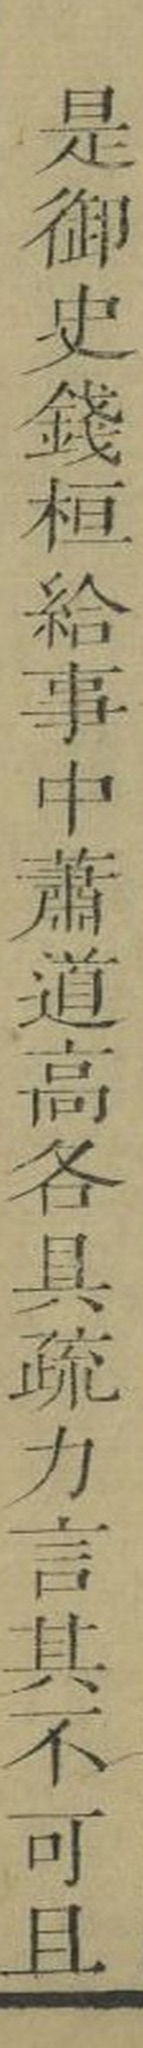是御史銭桓給事中蕭道高各具疏力言其不可且
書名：中山伝信録 巻三
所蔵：University of the Ryukyus Library
